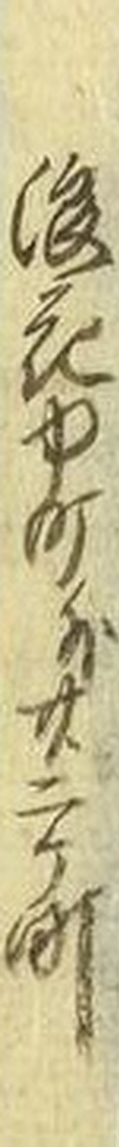浪花中町外廿二ヶ町
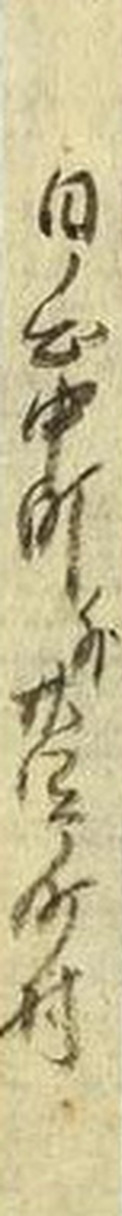日ノ出中町外廿四ヶ町村
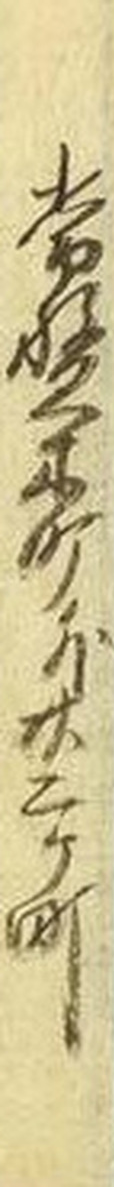常盤己木町外廿二ヶ町

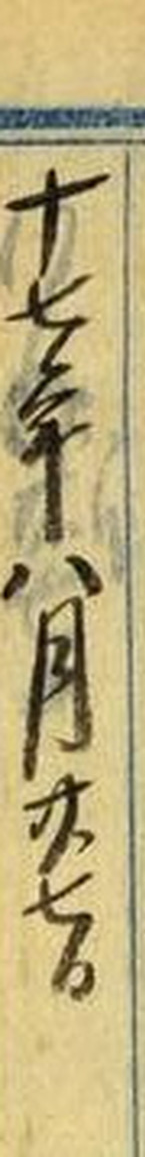十七年八月廿七日
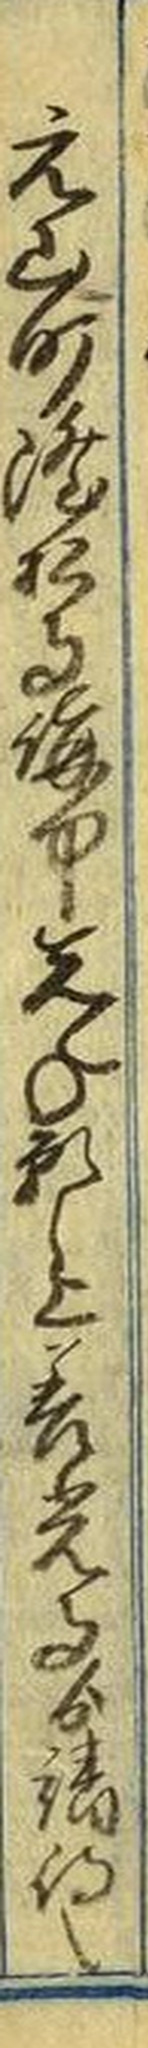元山町隆松寺講中先年願之上善光寺ゟ請待之
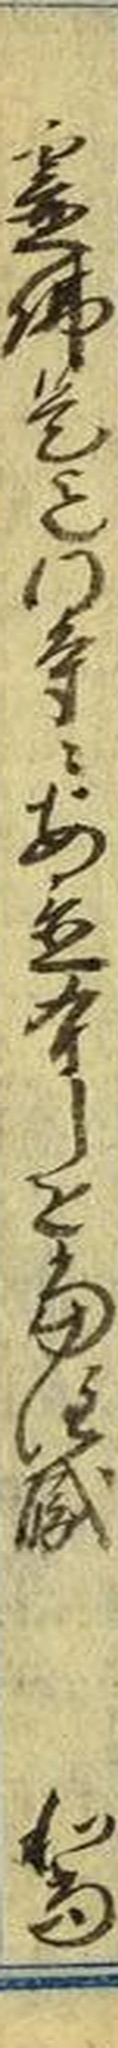霊仏是迄同寺に安置有しを当住職和尚
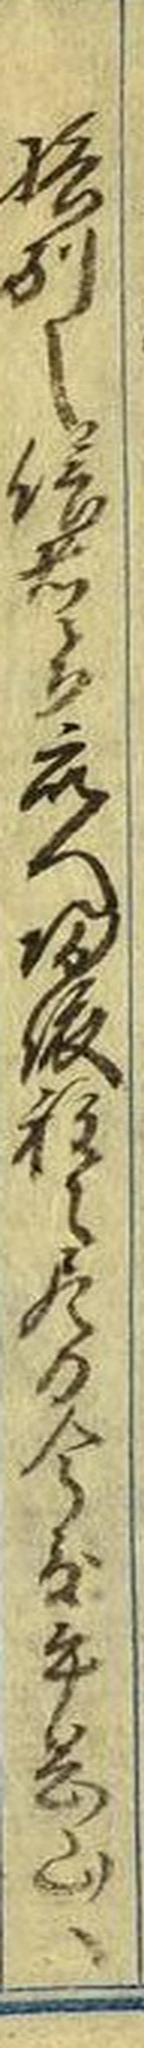格別之信者に而衆人帰依種々尽力今度午岡山へ
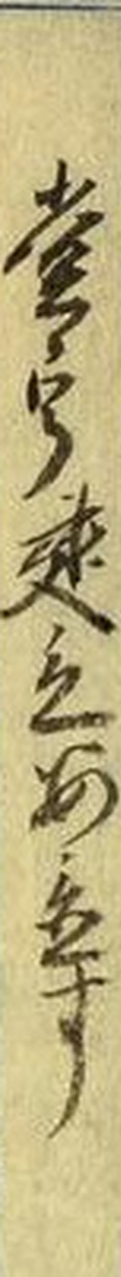堂宇建立安置す
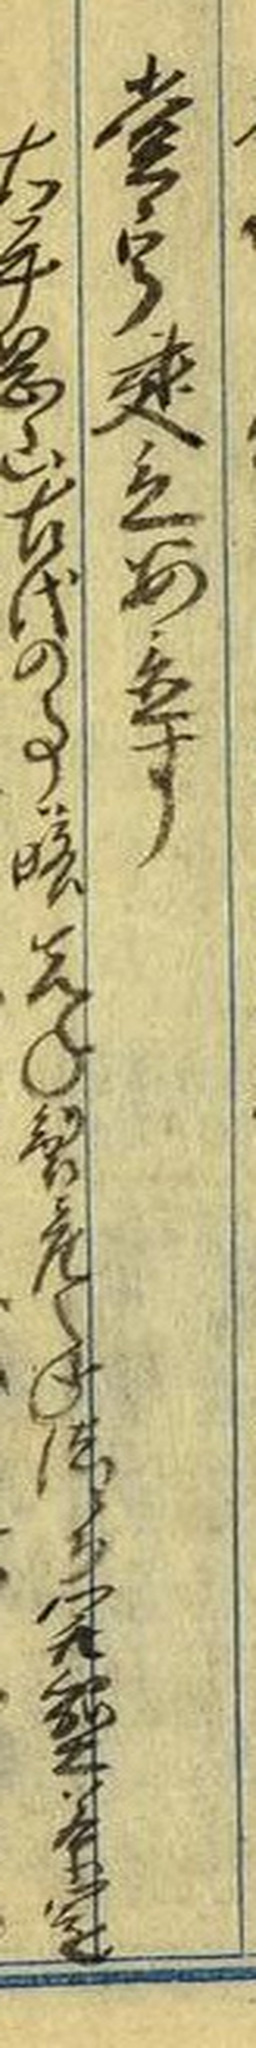右午岡山古代の事は略先年製産之趣法に而開墾茶園
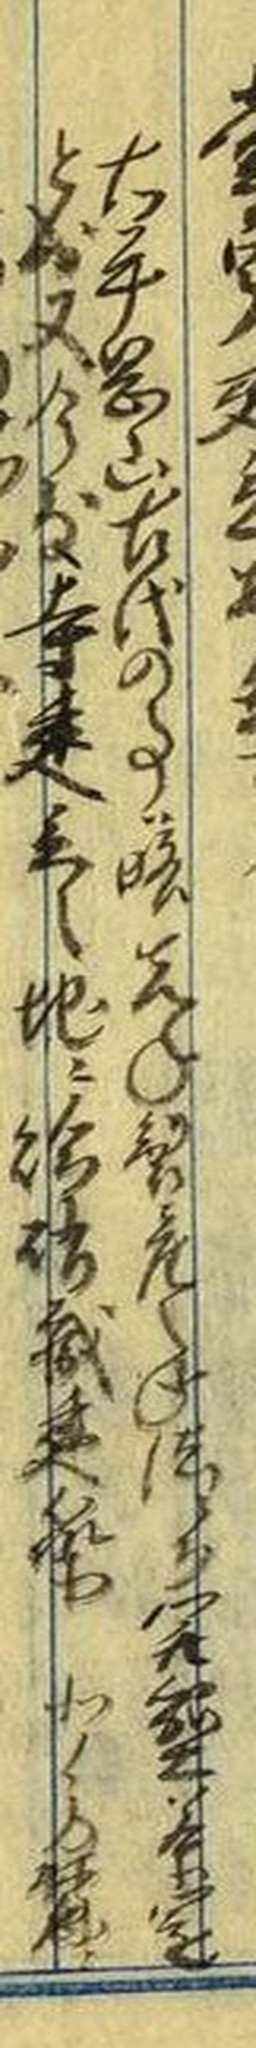と成又今度寺建立之地に焔硝蔵建築北の方麓
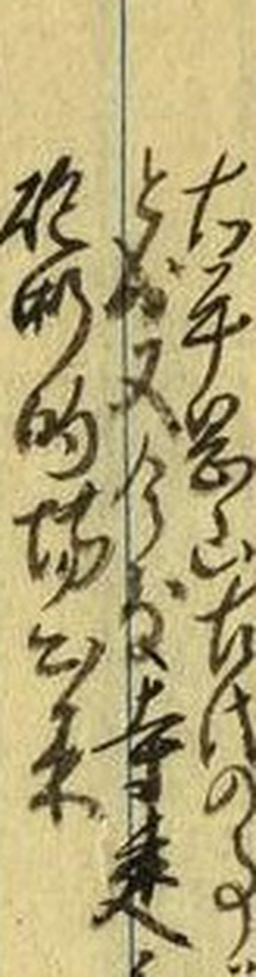砲術的場出来
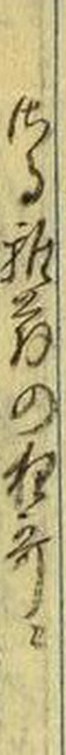さる雅翁の狂歌に
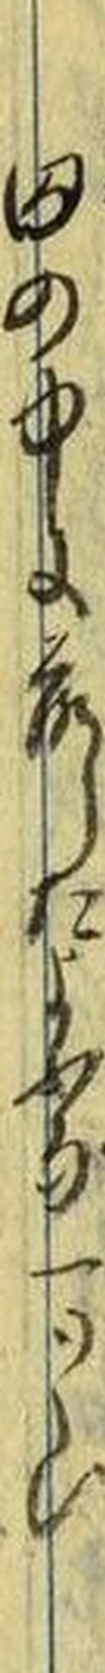田の中に落したよふな一ッ山
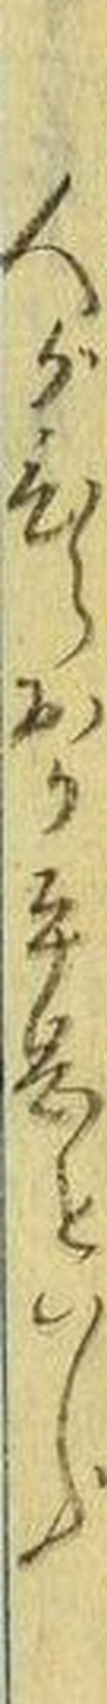人がひらおか午岡といふ
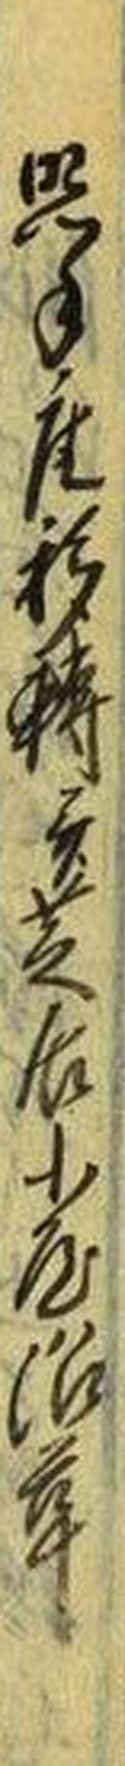照手座移転并芝居小屋沿革
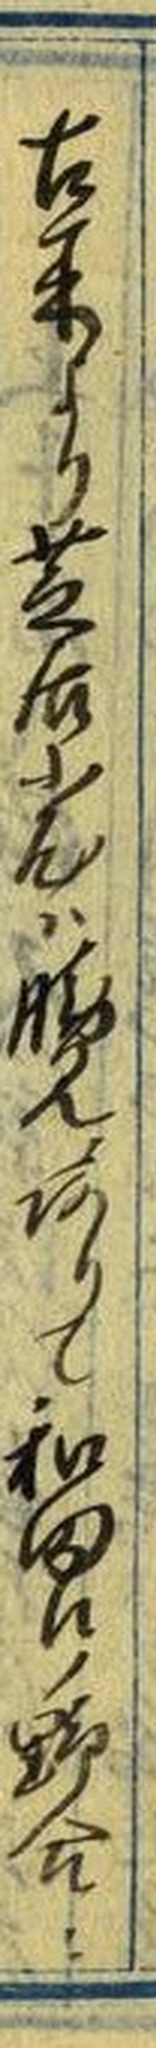古来より芝居小屋は勝見にありて和田えの野合に
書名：温古集 五巻
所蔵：福井県文書館 Fukui Prefectural Archives
